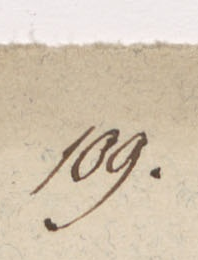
109.
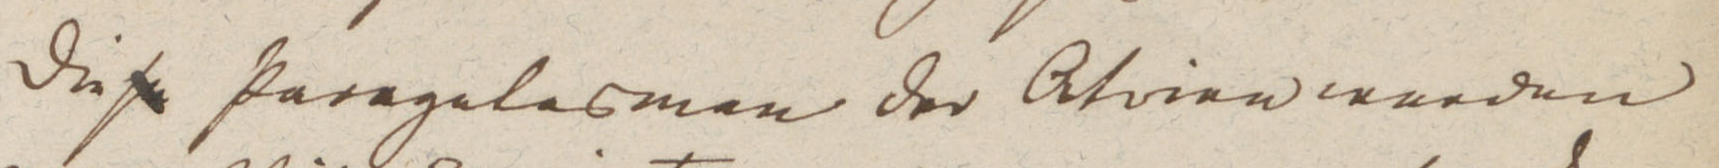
Diese Parapetasmen der Atrien werden
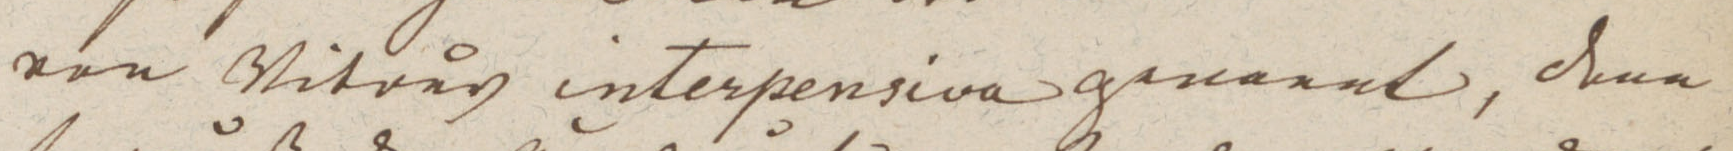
von Vitruv interpensiva genannt, denn
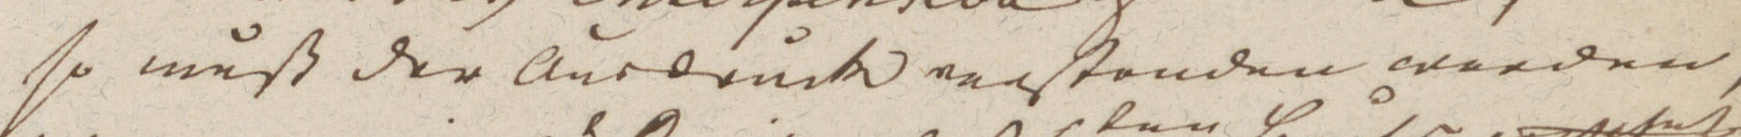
so muss der Ausdruck verstanden werden,
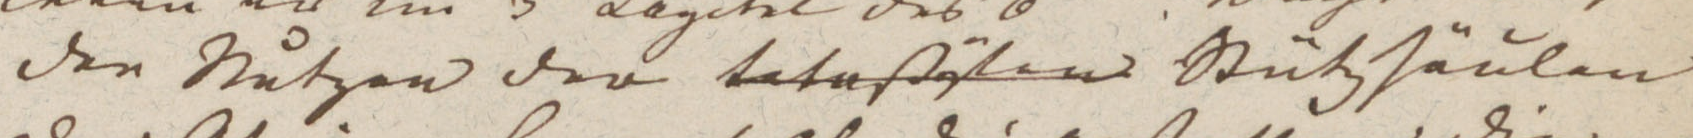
den Nutzen der tetastylen Stützsäulen
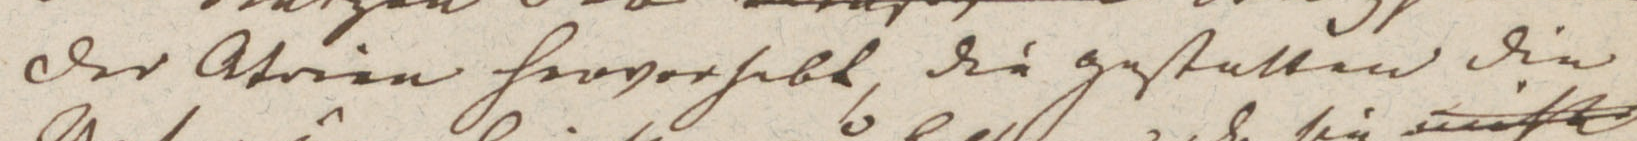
der Atrien hervorhebt, die gestatten die
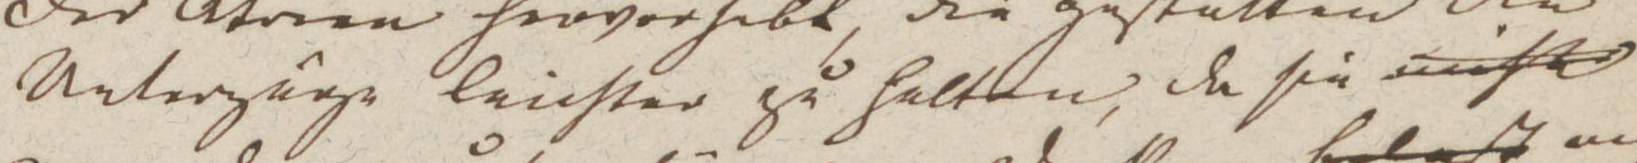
Unterzüge leichter zu halten, da sie nicht
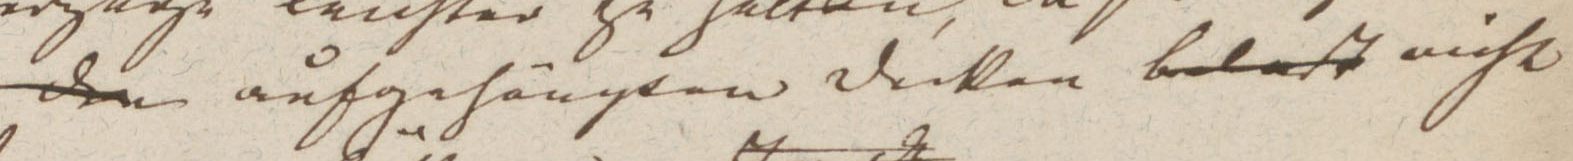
den aufgehängten Decken belast nicht
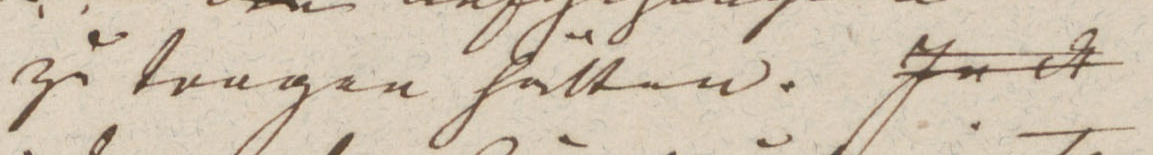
zu tragen hätten. In d
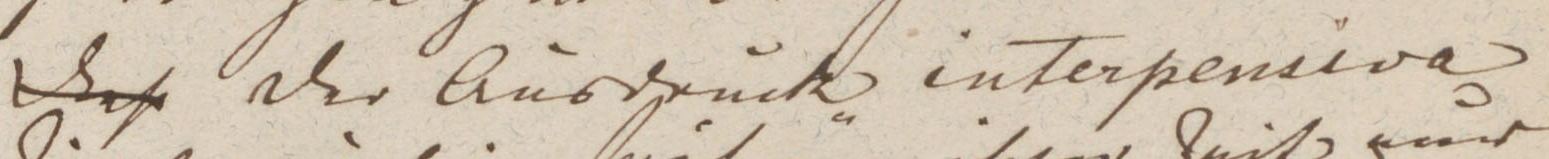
Diese Der Ausdruck interpensiva
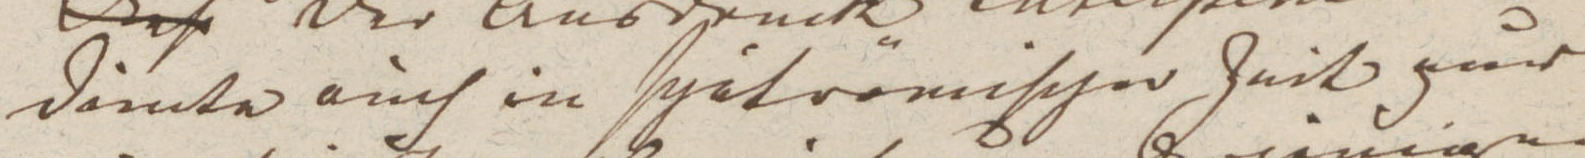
diente auch in spätrömischer Zeit zur
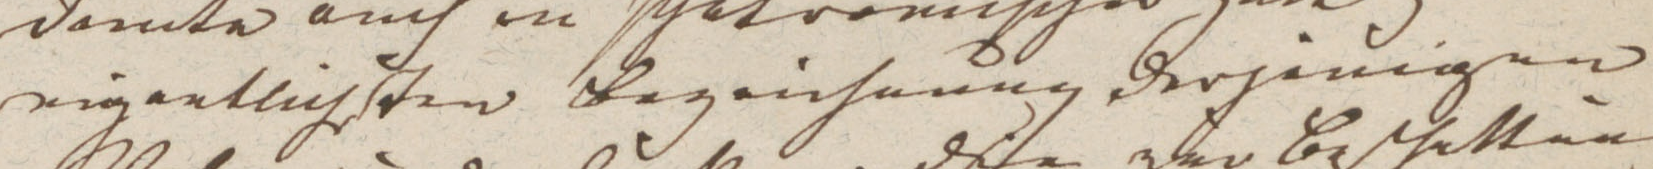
eigentlichsten Bezeichnung derjenigen
